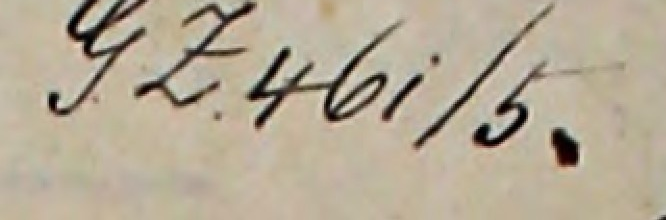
G.Z. 461/5.
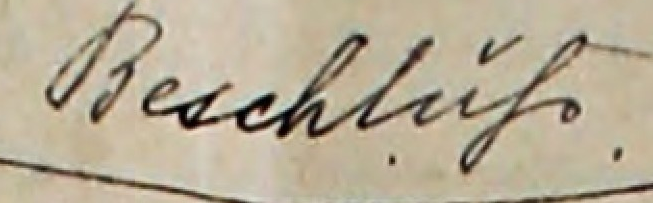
Beschluss.
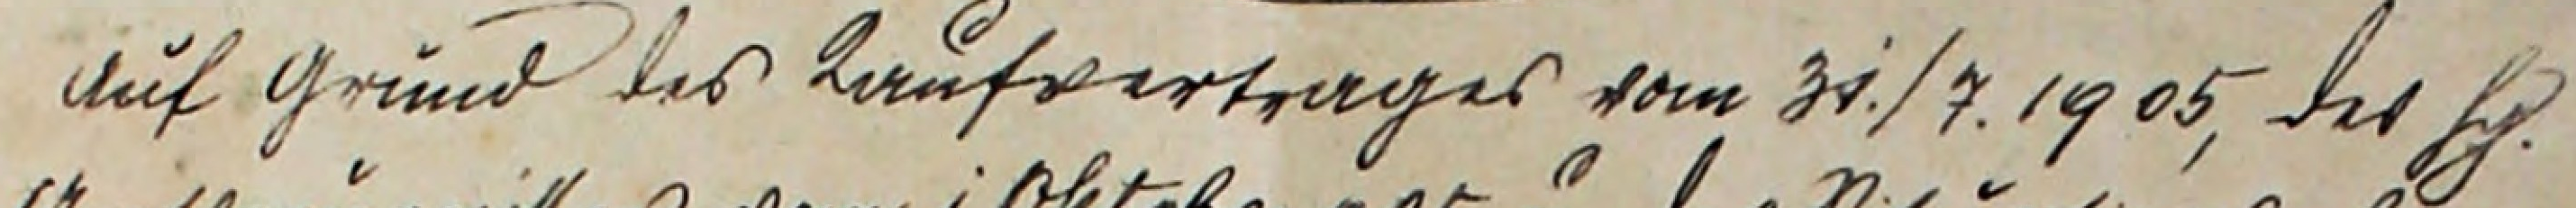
Auf Grund des Kaufvertrages vom 31./7.1905, des hg.
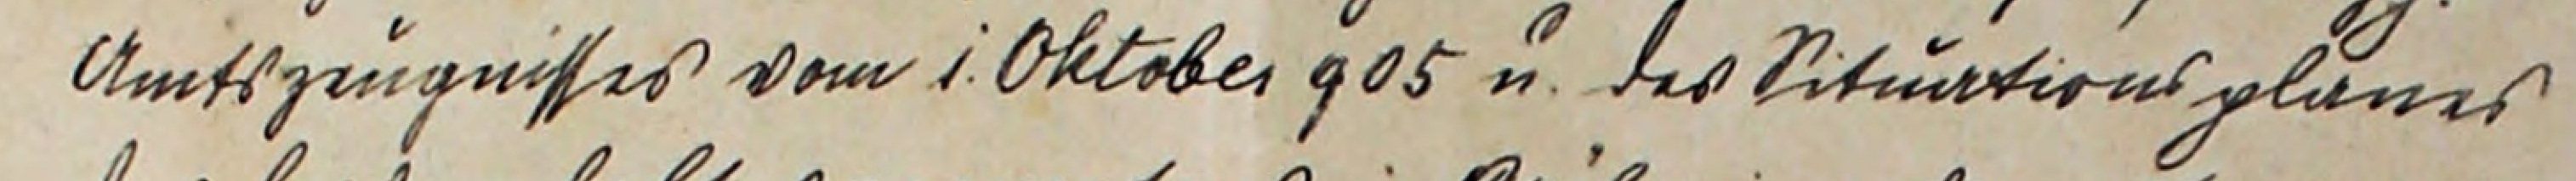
Amtszeugnisses vom 1. Oktober 905 u. des Situationsplanes
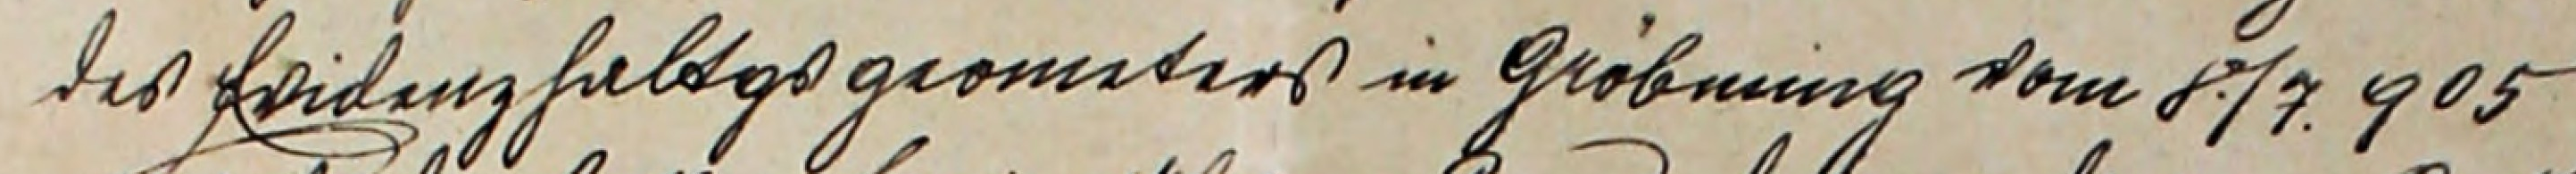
des Evidenzhaltgsgeometers in Gröbming vom 8./7.905
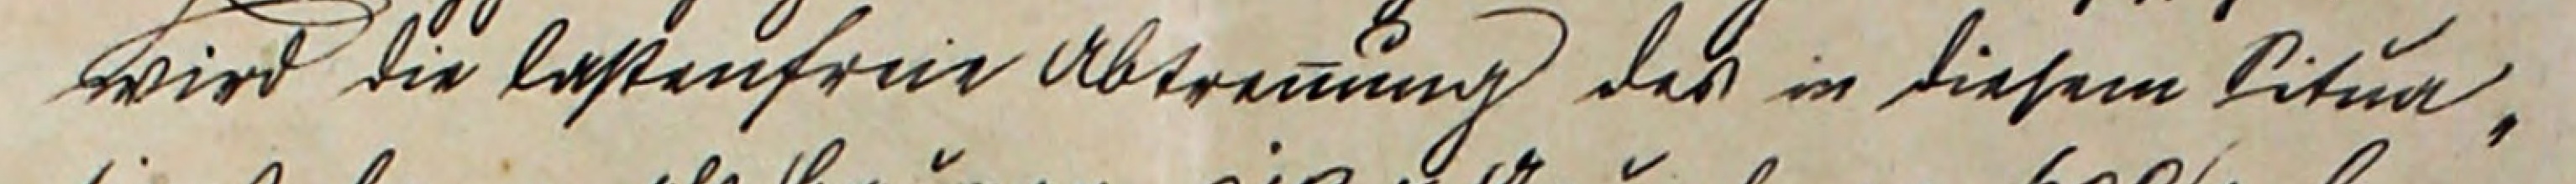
wird die lastenfreie Abtrennung des in diesem Situa„
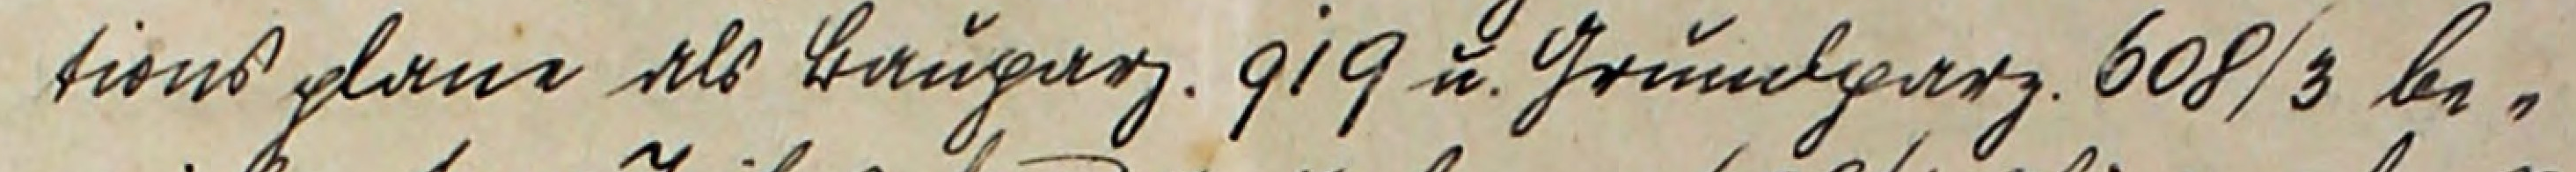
tionsplane als Bauparz. 919 u. Grundparz. 608/3 be„
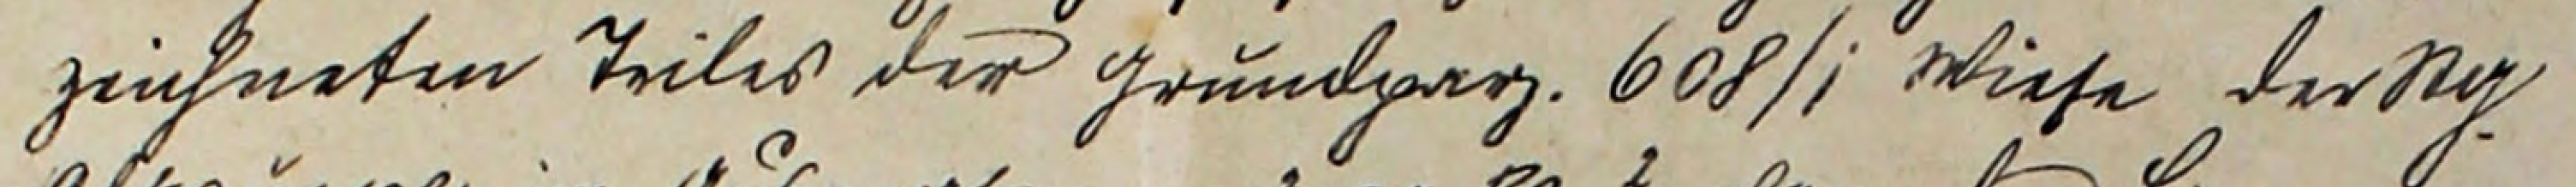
zeichneten Teiles der Grundparz. 608/1 Wiese der Stg
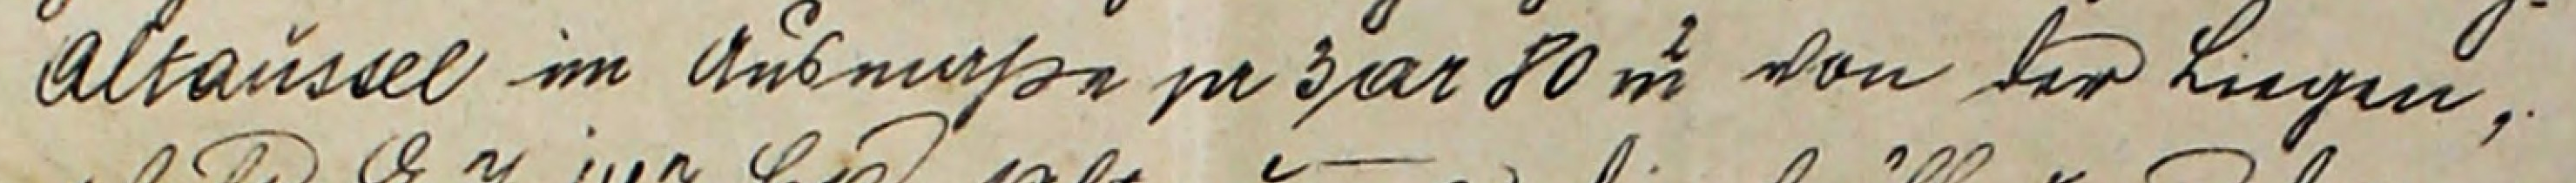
Altaussee im Ausmaße pr 3 ar 80 m2 von der Liegen,
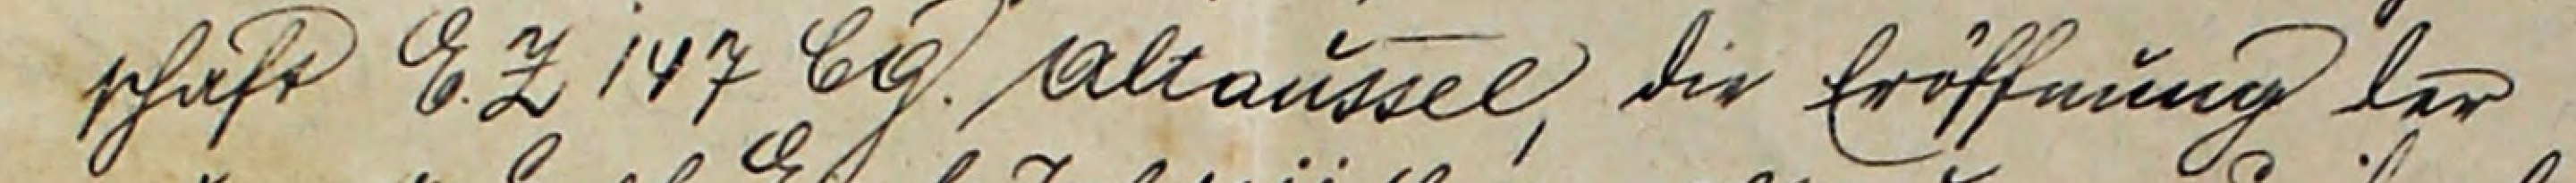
schaft E.Z 147 Gg. Altaussee, die Eröffnung der
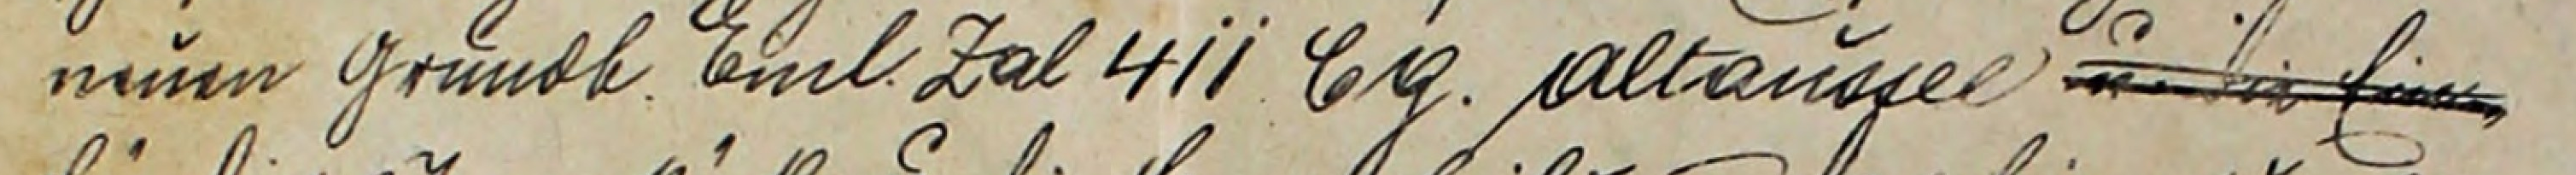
neuen Grundb. Einl. Zal 411 Cg. Altaussee
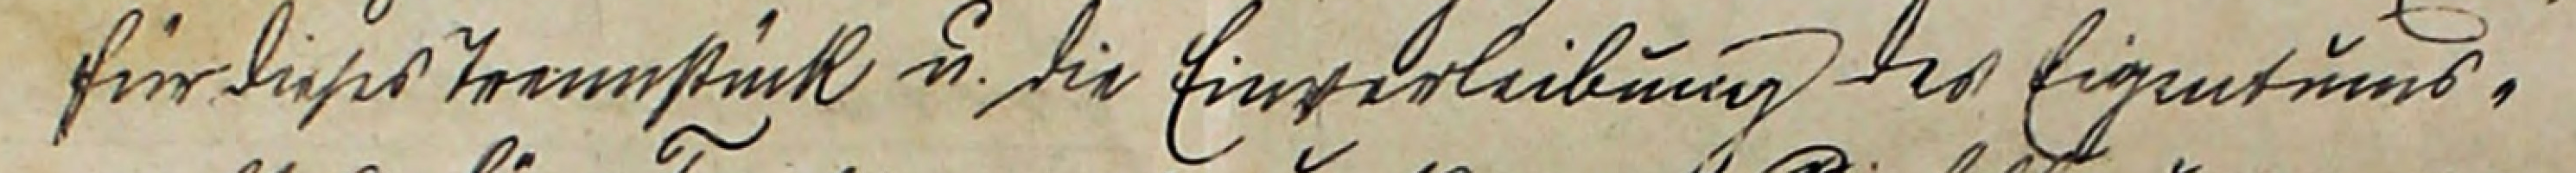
für dieses Trennstück u. die Einverleibung des Eigentums„
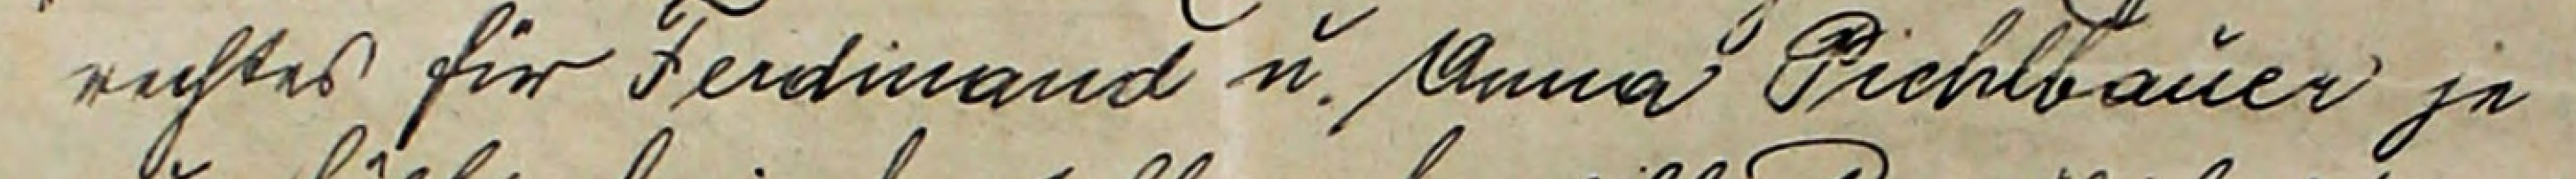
rechtes für Ferdinand u. Anna Pichlbauer je
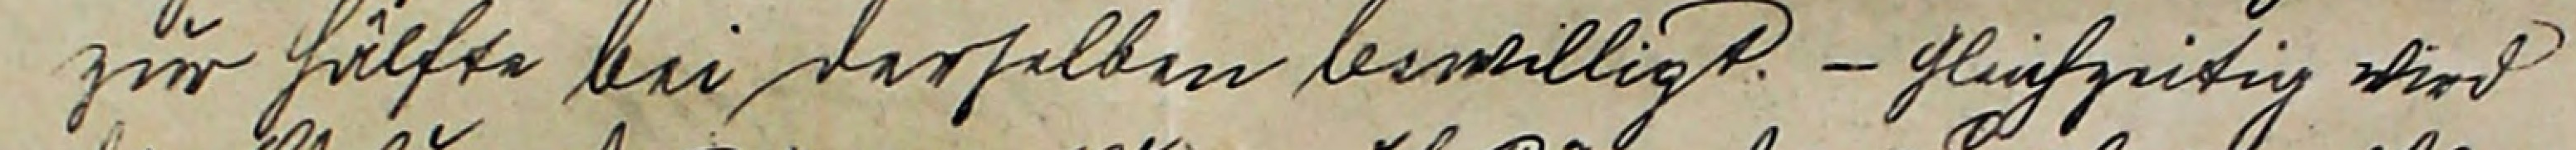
zur hälfte bei derselben bewilligt. - Gleichzeitig wird
